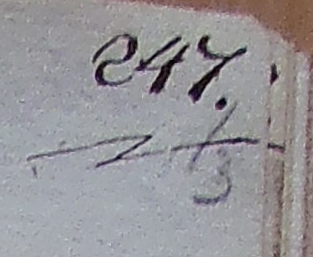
247./3
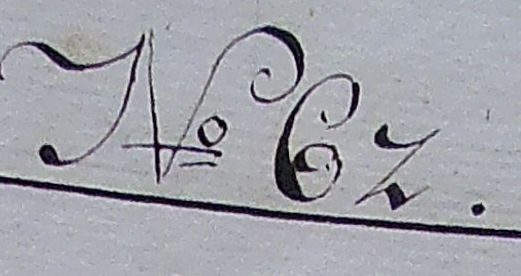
No͇ 62.
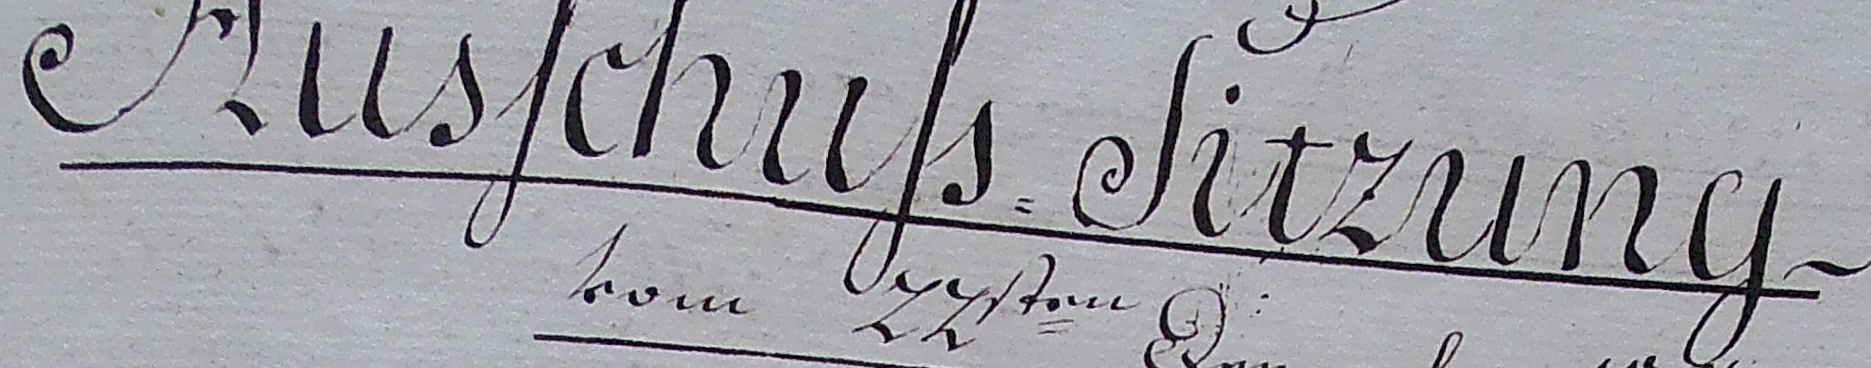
Ausschuss ‗Sitzung
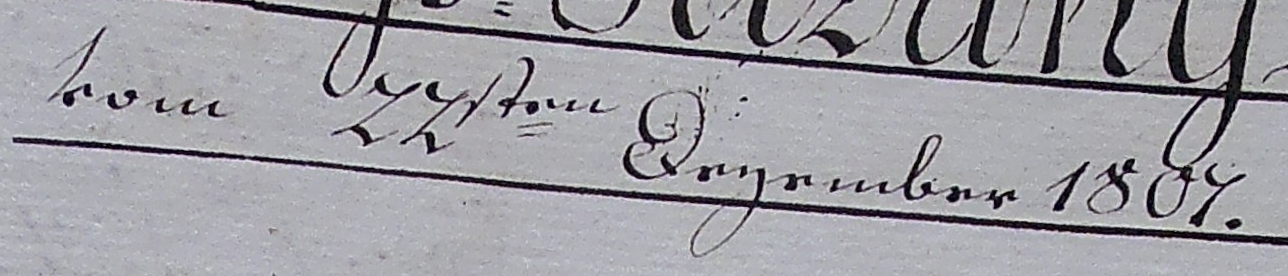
vom 22ste͇n Dezember 1807.
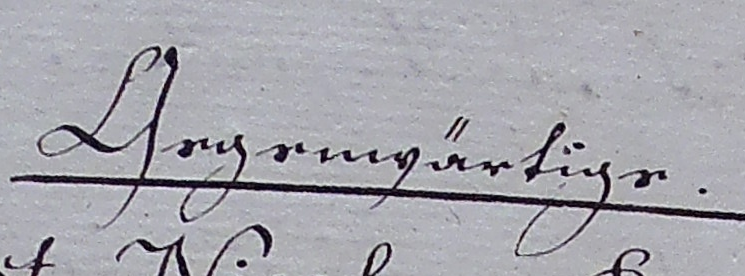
Gegenwärtige.
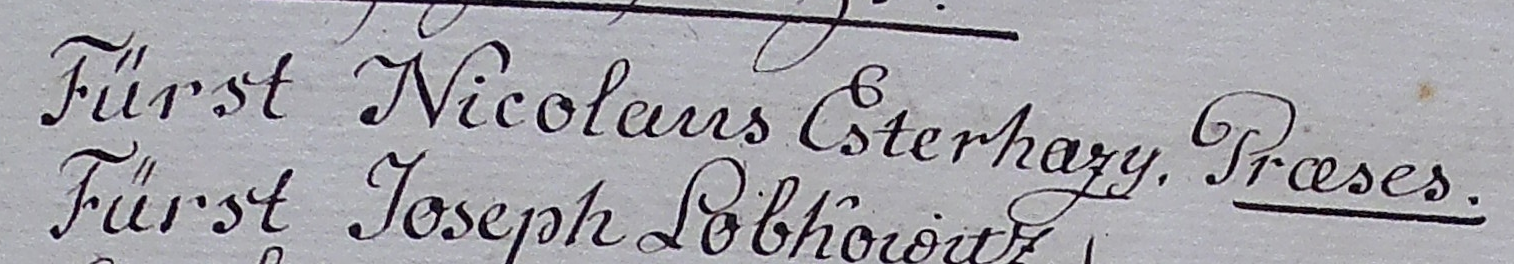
Fürst Nicolaus Esterhazy. Præses.
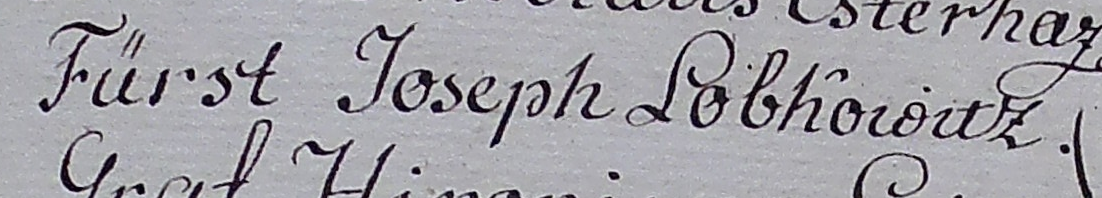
Fürst Joseph Lobkowitz.
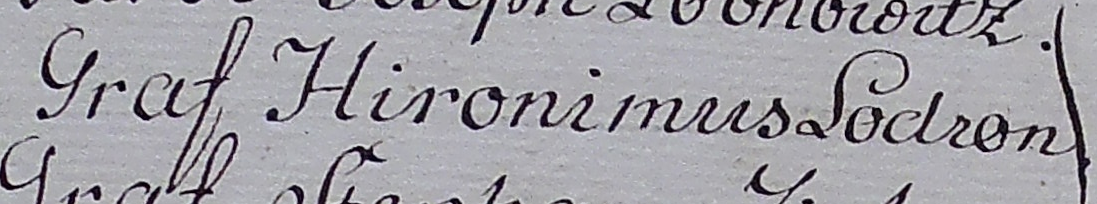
Graf Hironimus Lodron
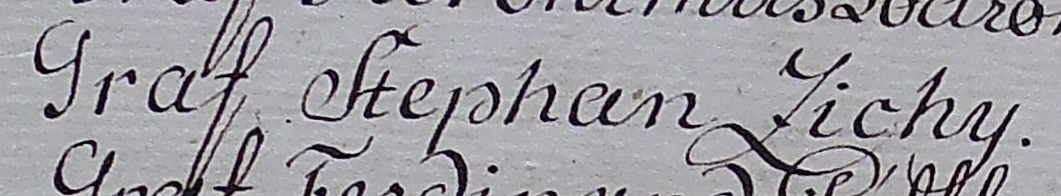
Graf Stephan Zichy.
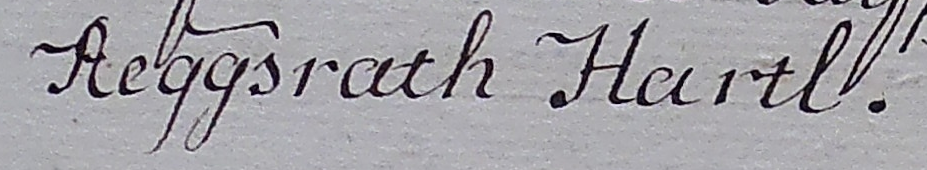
Reg͞gsrath Hartl.
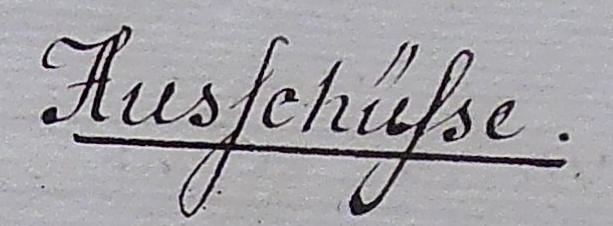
Ausschüsse.
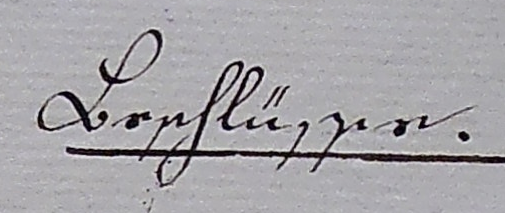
Beschlüsse.
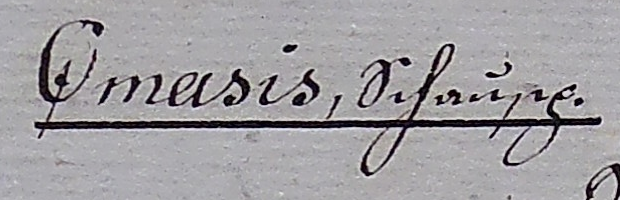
Omasis, Schausp.
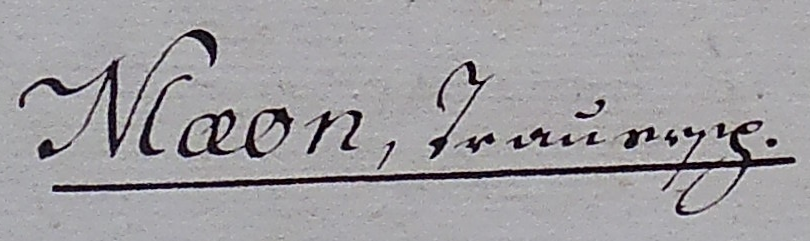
Mæon, Trauersp.
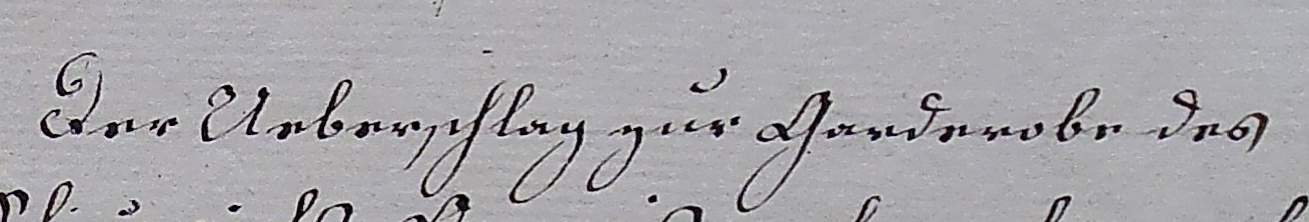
Der Ueberschlag zur Garderobe des
